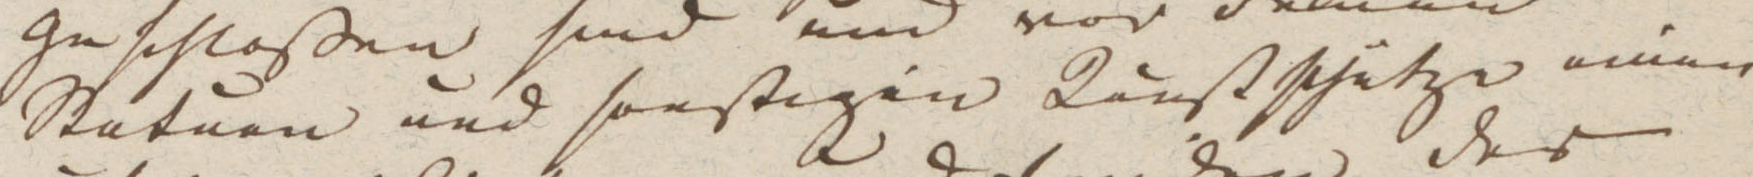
Statuen und sonstigen Kunstschätze einen
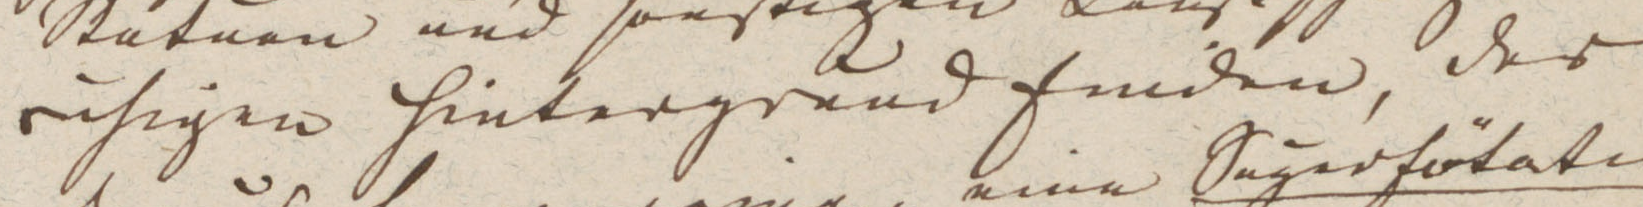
ruhigen Hintergrund finden, der
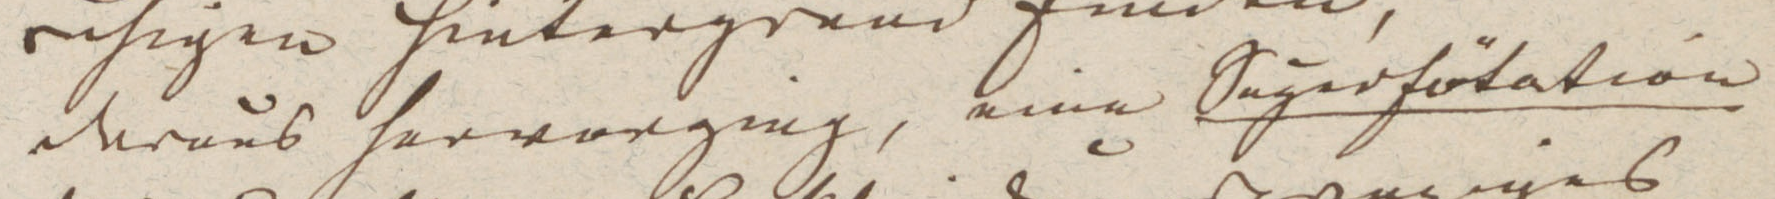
daraus hervorging, eine Superfötation
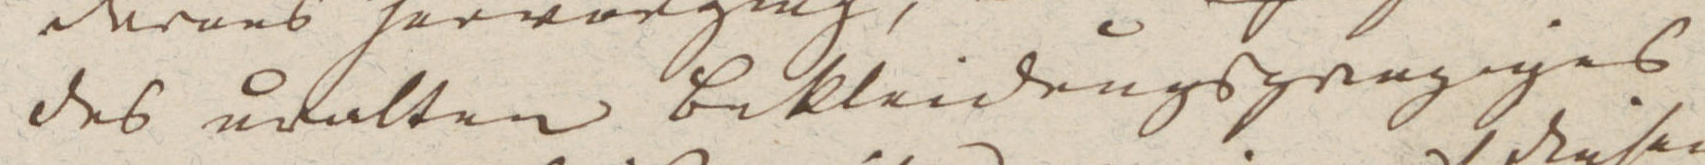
des uralten Bekleidungsprinzipes
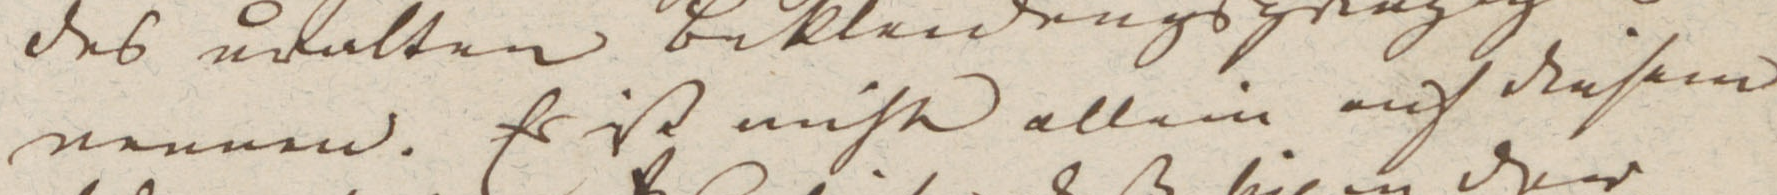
nennen. Es ist nicht allein auf diesem
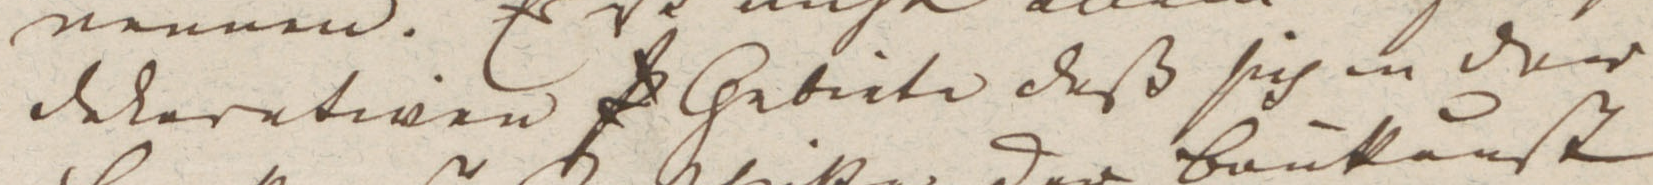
dekorativen P Gebiete dass sich in der
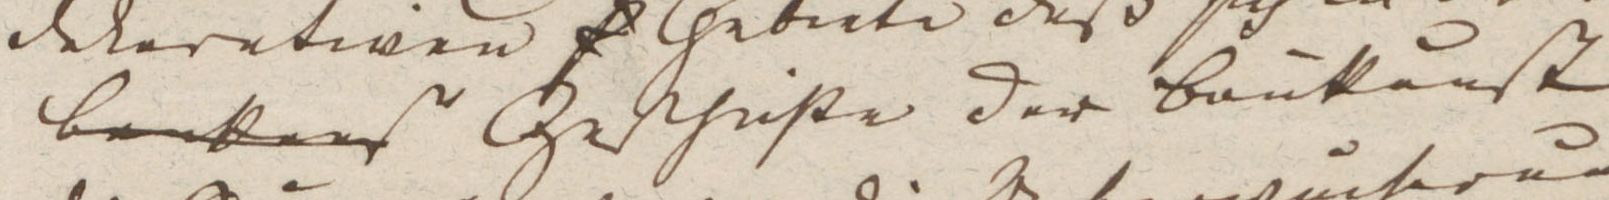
Baukuns Geschichte der Baukunst
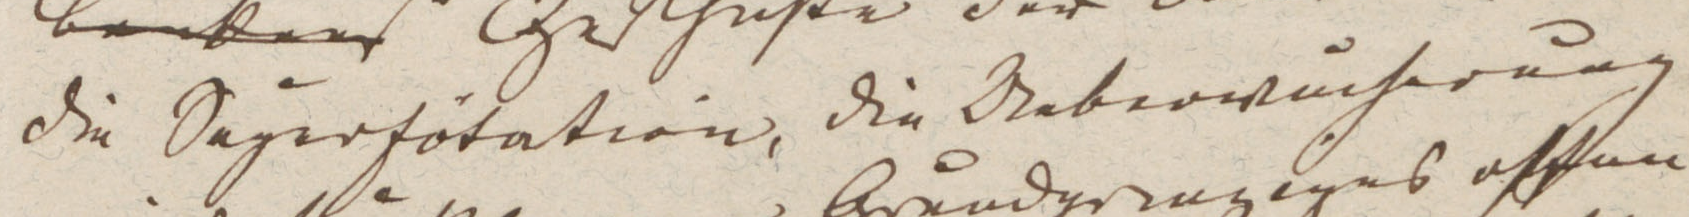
die Superfötation, die Ueberwucherung
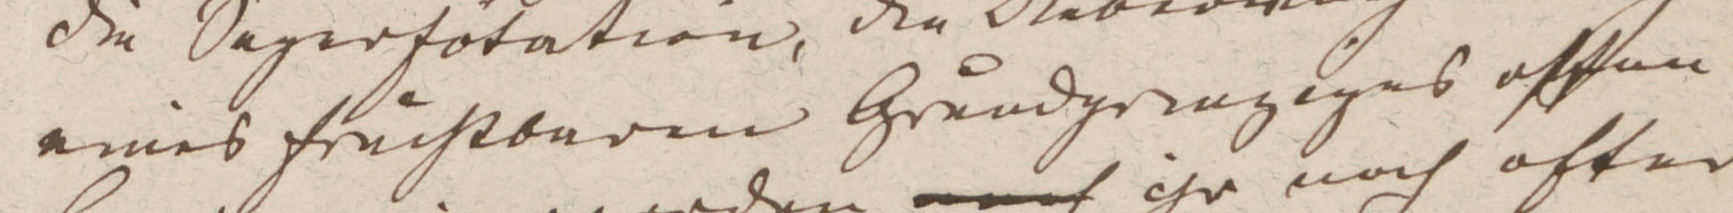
eines fruchtbaren Grundprinzipes offen-
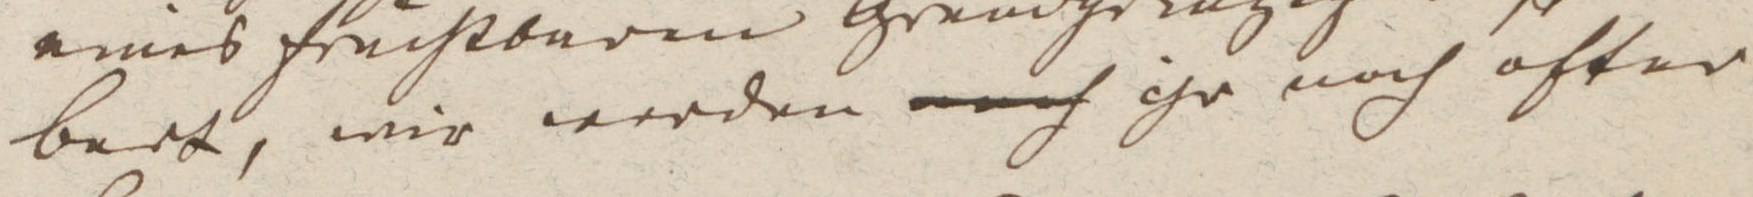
bart, wir werden noch ihr noch öfter
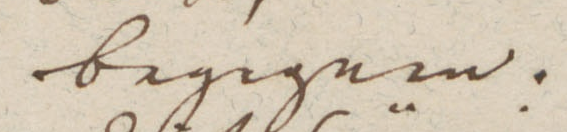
begegnen.
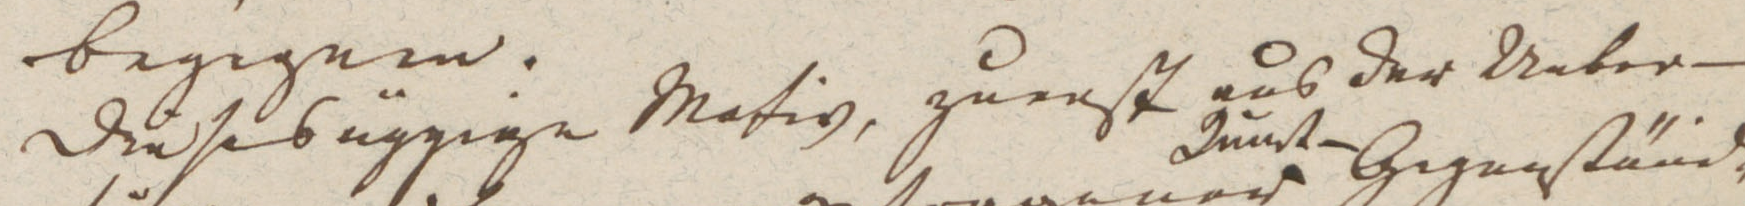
Dieses üppige Motiv, zuerst aus der Ueber-
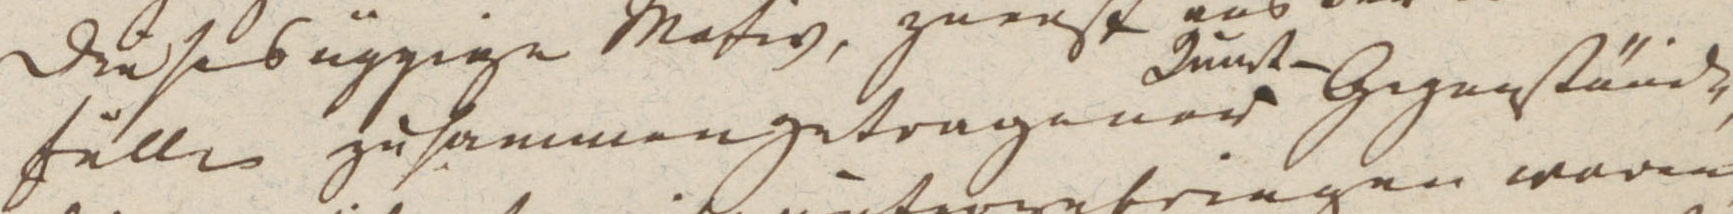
fülle zusammengetragener Kunst-Gegenstände,
